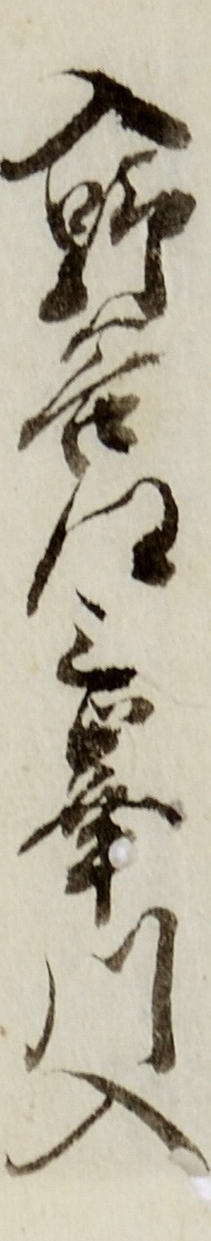入野谷郷三峯川入
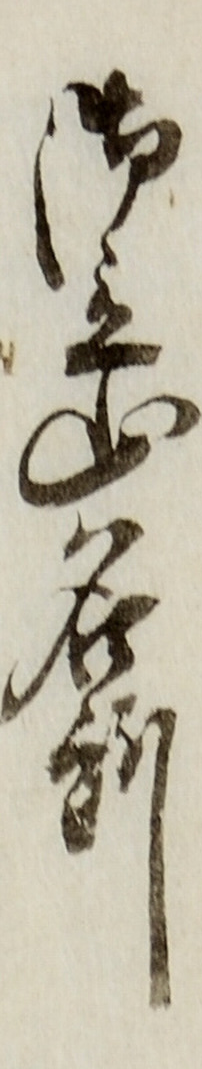御立山名所
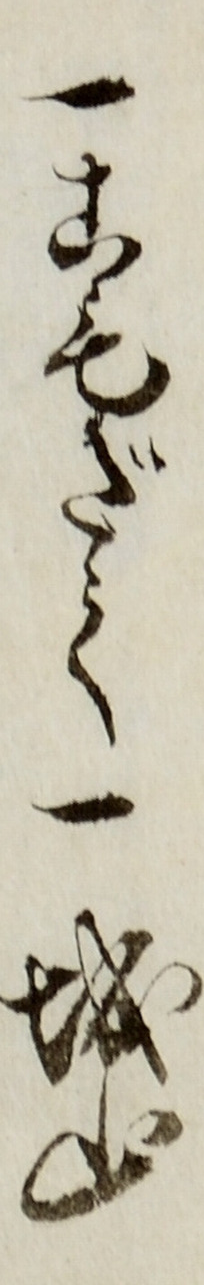一こもだて一城山
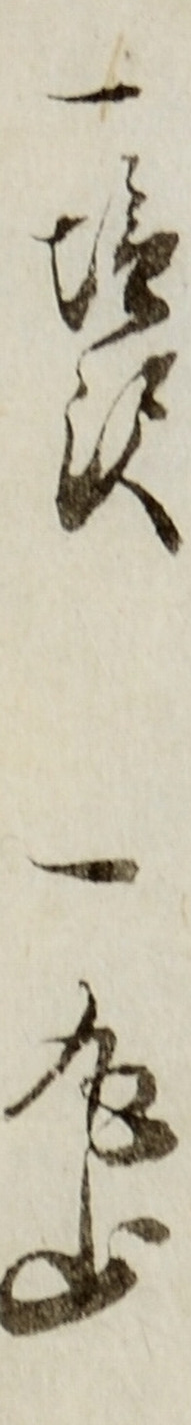一塩沢一丸山
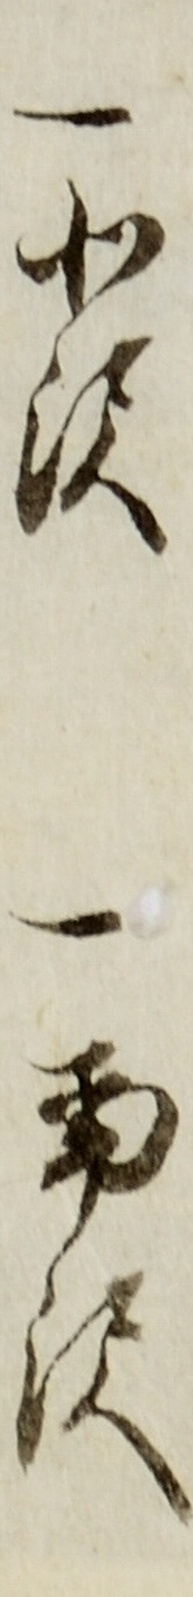一北沢一南沢
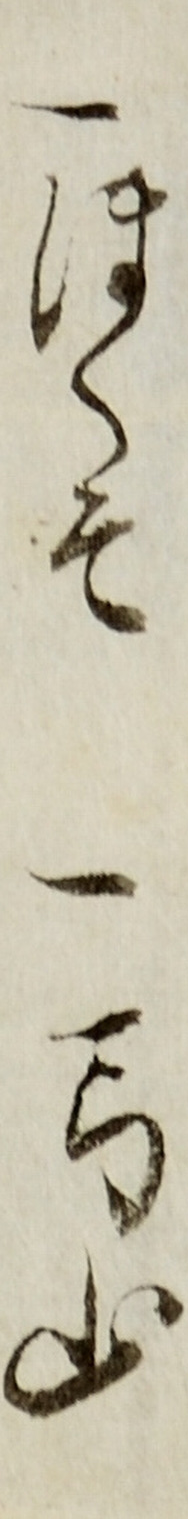一ほくそ一弓山
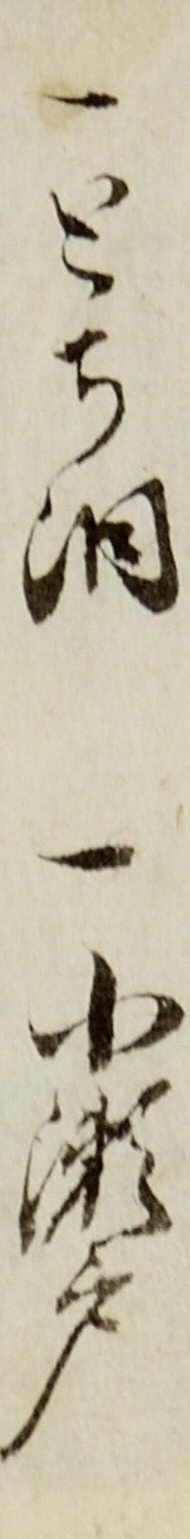一とち洞一小瀬戸
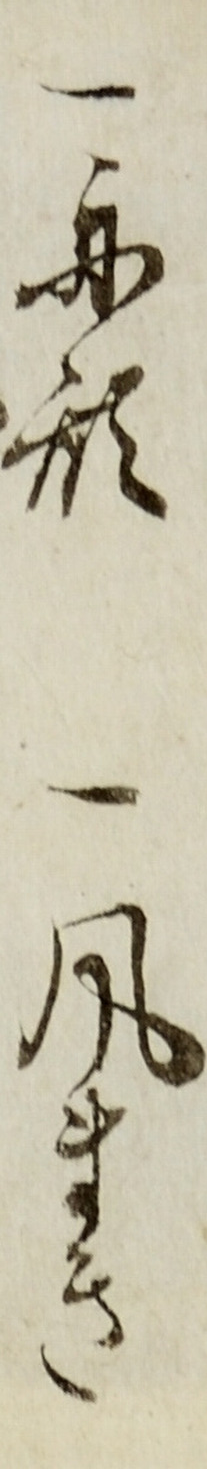一舟形一風まき
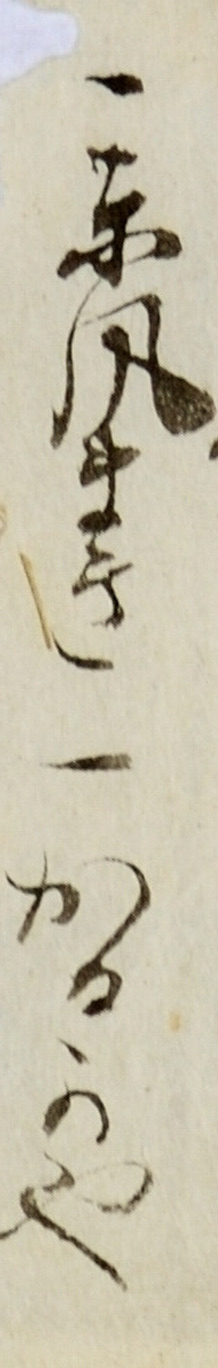一東風まき一かるかや
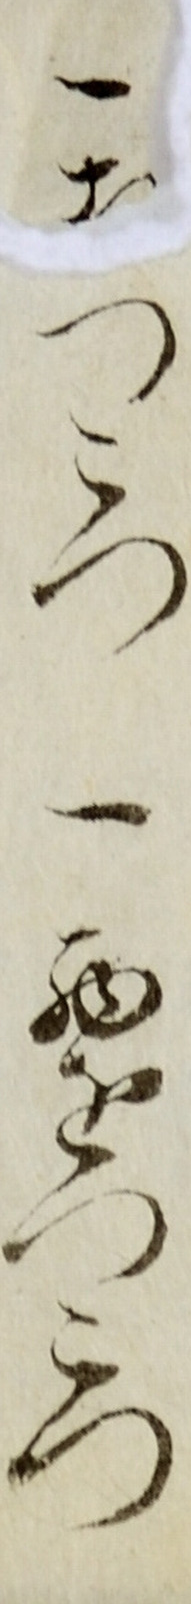一をつこつ一西をつこつ
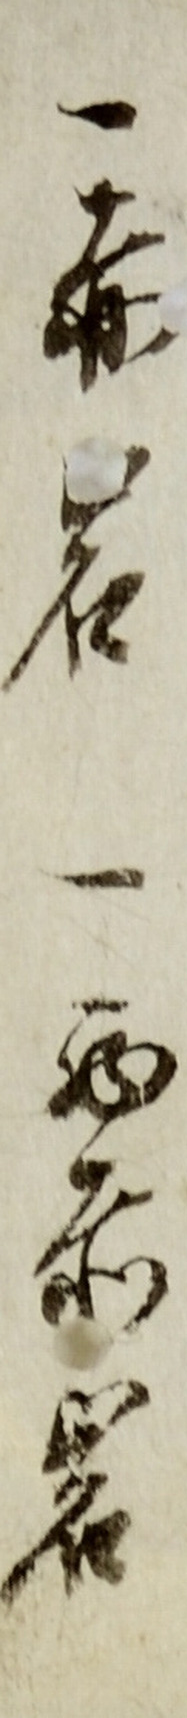一赤岩一西赤岩
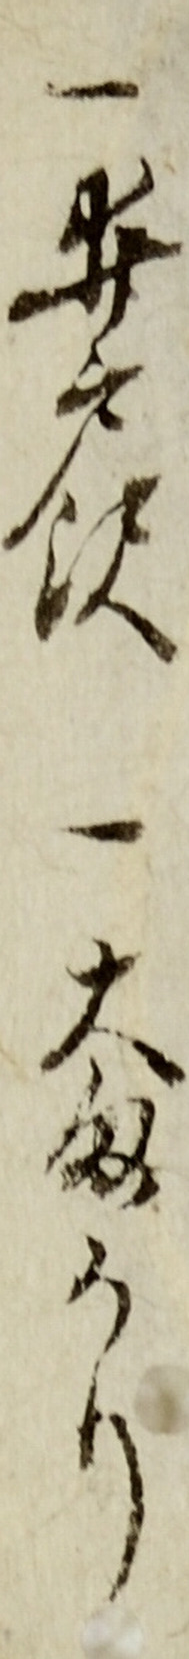一井戸沢一大まかり

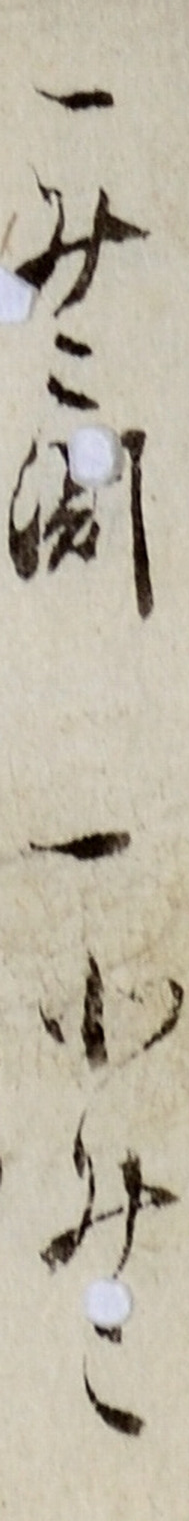一みこ渕一北みこ
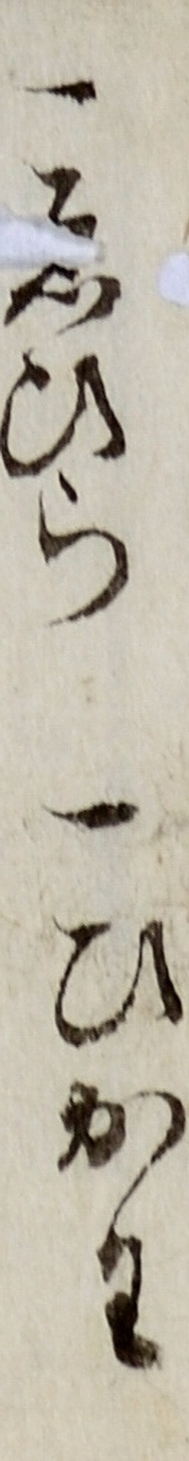一ゑひら一ひかわ
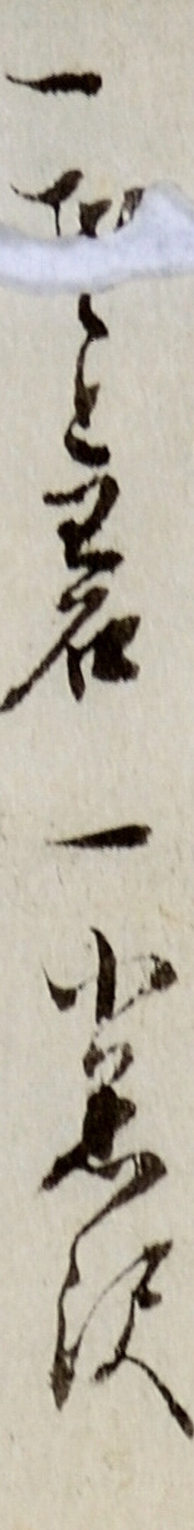一そとわ石一小黒沢
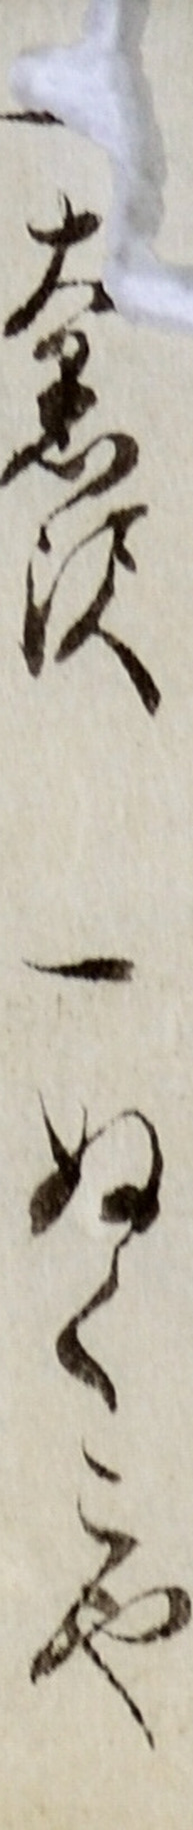一大黒沢一ぬくこや
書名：入野谷郷三峯川入御立山名所
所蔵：伊那市立高遠町図書館・合同会社AMANE
